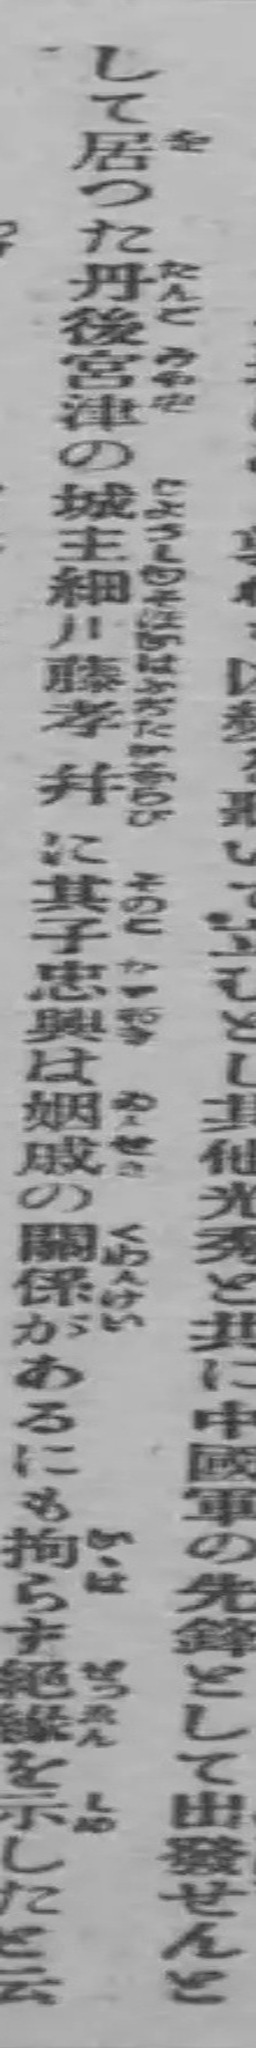して居つた丹後宮津の城主細川藤孝幷に其子忠興は姻戚の関係があるにも拘らず絶縁を示したと云
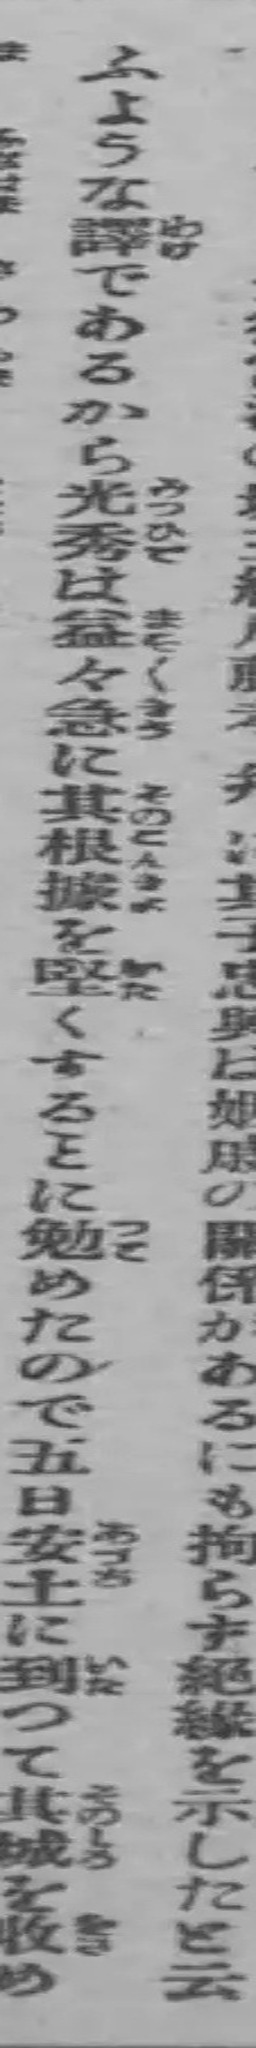ふような訳であるから光秀は益々急に其根拠を堅くすることに勉めたので五日安土に到つて其城を収め
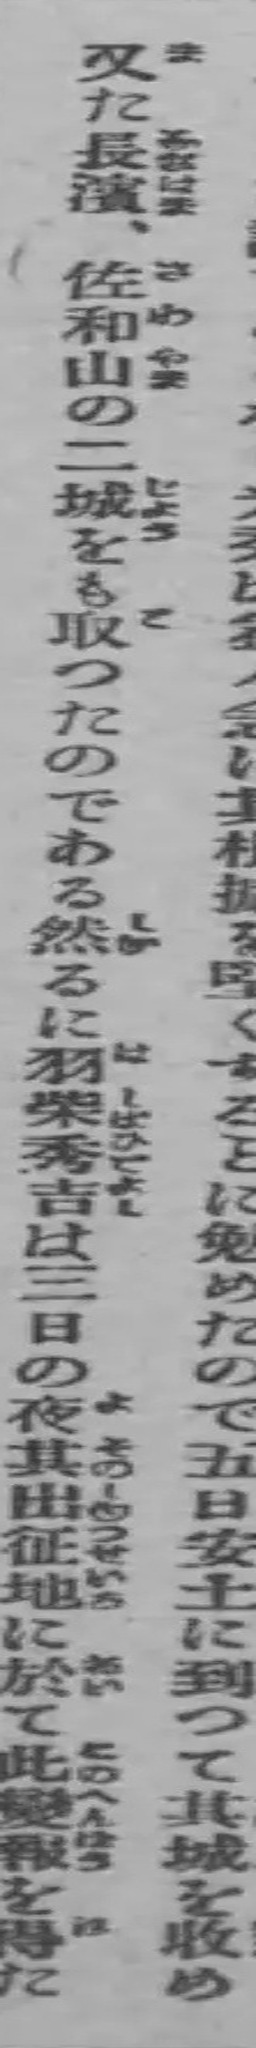又た長浜、佐和山の二城をも取つたのである然るに羽柴秀吉は三日の夜其出征地に於て此変報を得た
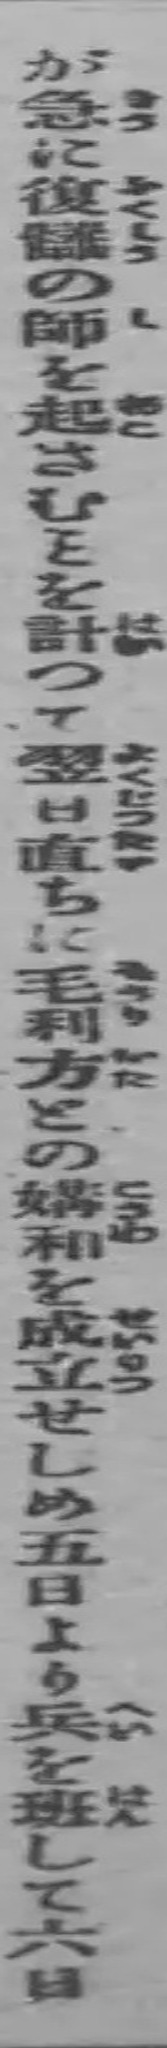が急に復讐の師を起さむことを計つて翌日直ちに毛利方との媾和を成立せしめ五日より兵を班して六日
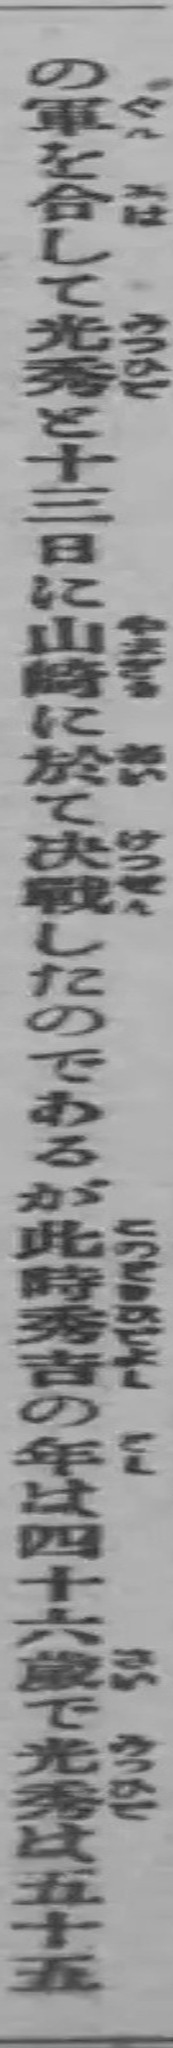山崎役の軍を合して光秀と十三日に山崎に於て決戦したのであるが此時秀吉の年は四十六歳光秀は五十五
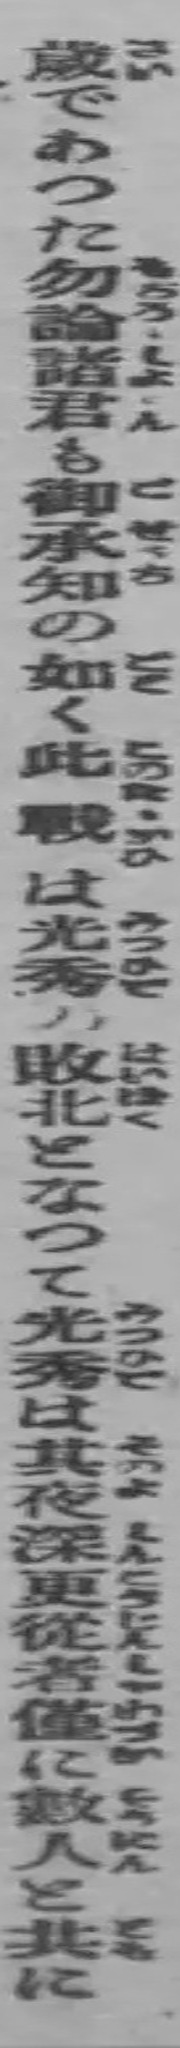歳であつた勿論諸君も御承知の如く此戦は光秀の敗北となつて光秀は其夜深更従者僅に数人と共に
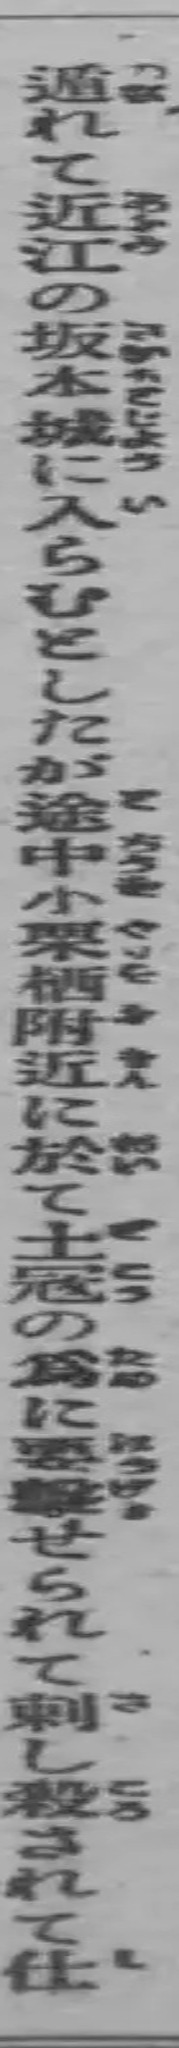遁れて近江の坂本城に入らむとしたが途中小栗栖附近に於て土寇の為に要撃せられて刺し殺されて仕
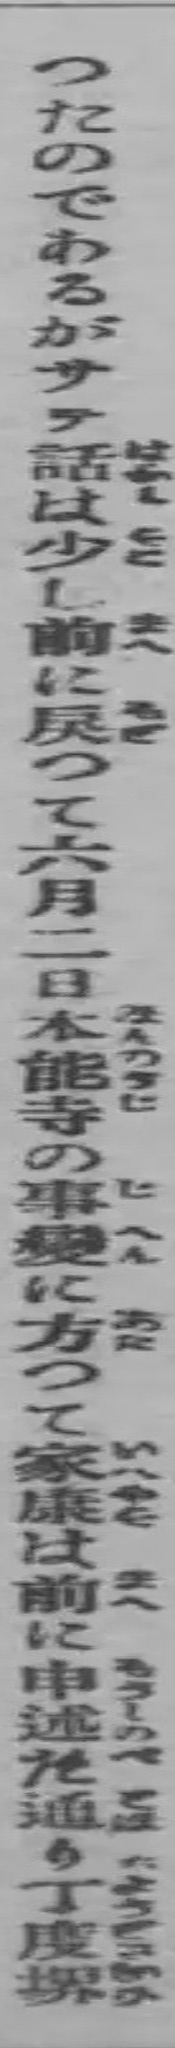つたのであるがサテ話は少し前に戻つて六月二日本能寺の事変に方つて家康は前に申述た通り丁度堺
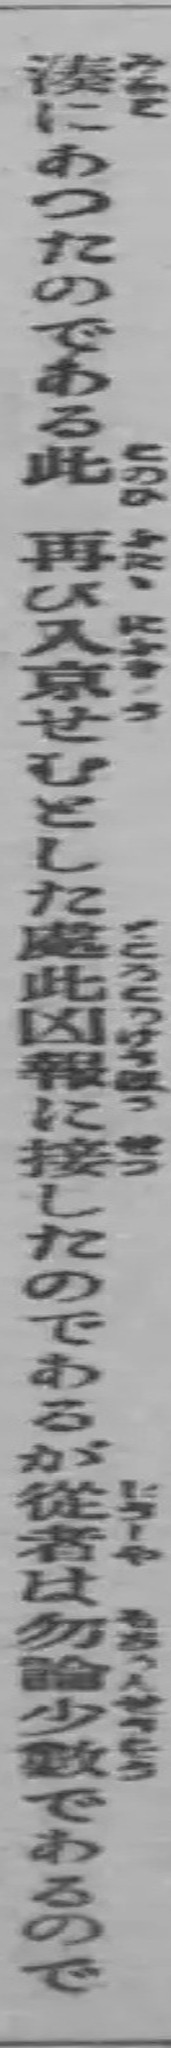湊にあつたのである此再び入京せむとした処此凶報に接したのであるが従者は勿論少数であるので
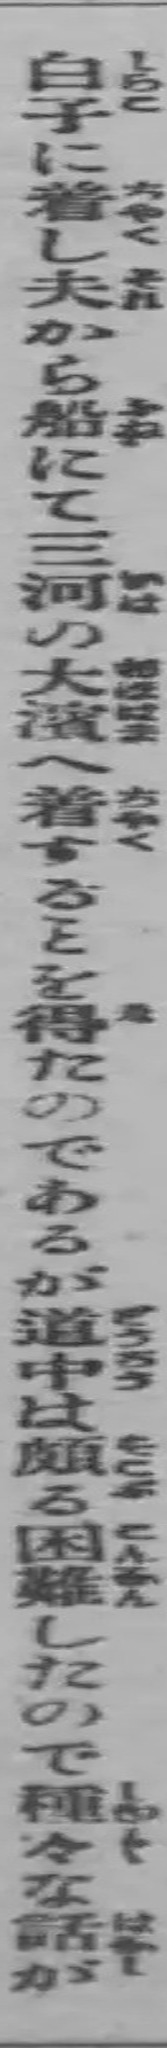白子に着し夫から船にて三河の大浜へ着することを得たのであるが道中は頗る困難したので種々な話が
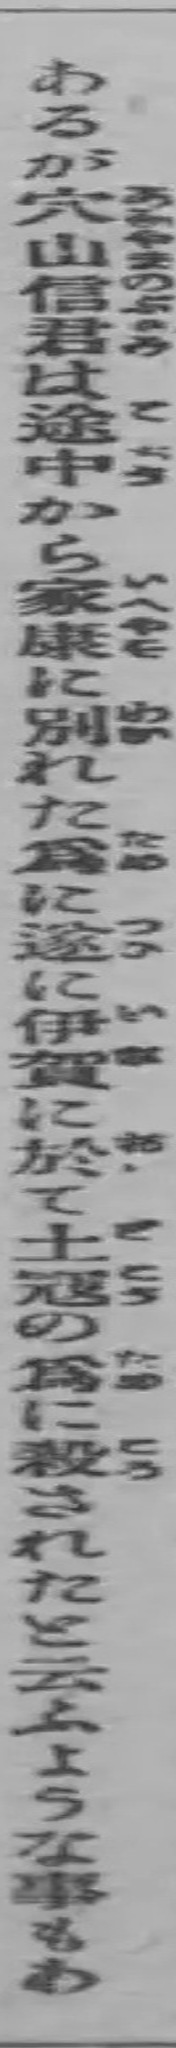あるが穴山信君は途中から家康に別れた為に遂に伊賀に於て土寇の為に殺されたと云ふような事もあ
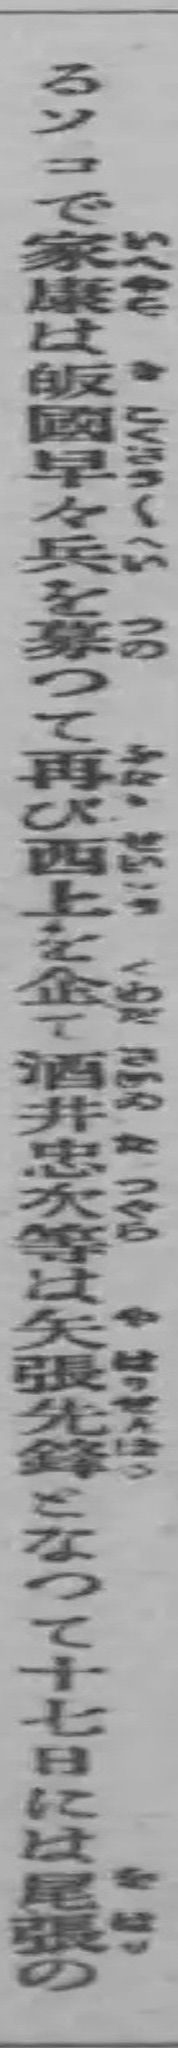るソコで家康は皈国早々兵を募つて再び西上を企て酒井忠次等は矢張先鋒となつて十七日には尾張の
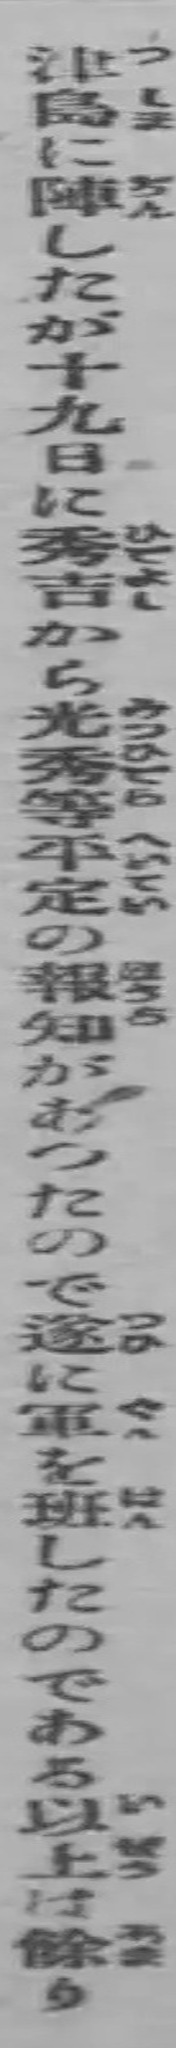津島に陣したが十九日に秀吉から光秀等平定の報知があつたので遂に軍を班したのである以上は余り
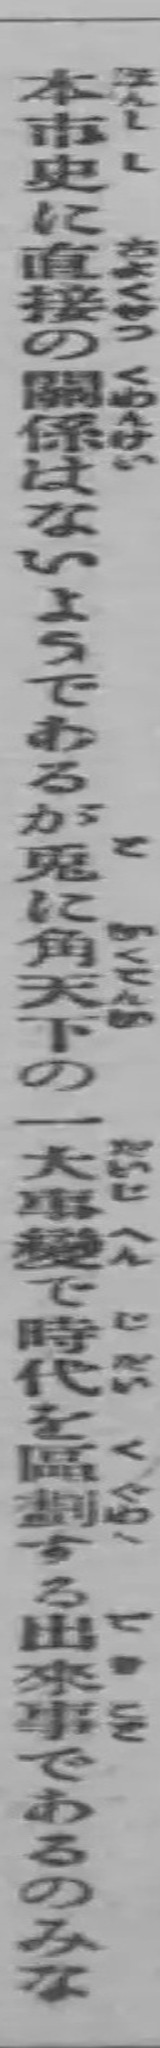本市史に直接の関係はないようであるが兎に角天下の一大事変で時代を区割する出来事であるのみな
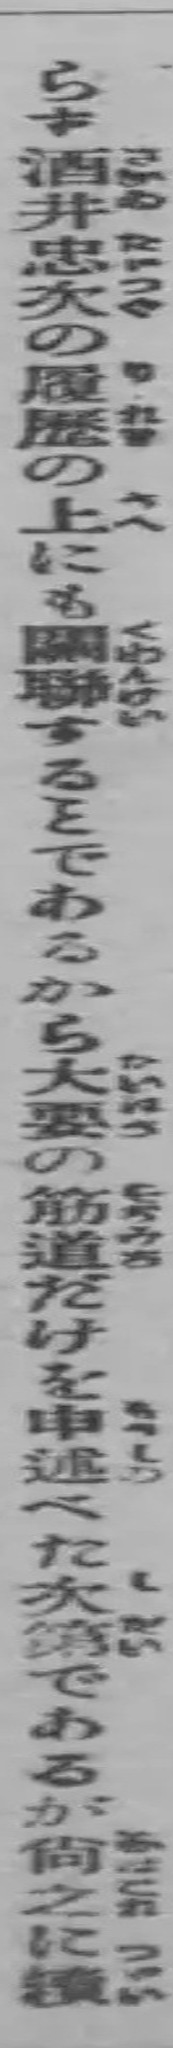らず酒井忠次の履歴の上にも関連することであるから大要の筋道だけを申述べた次第であるが尚之に続
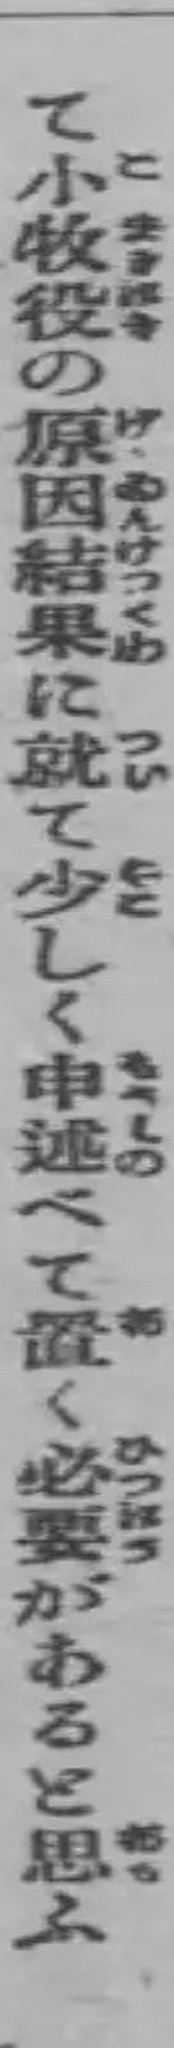て小牧役の原因結果に就て少しく申述べて置く必要があると思ふ
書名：豊橋市史談
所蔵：国立国会図書館 National Diet Library, JAPAN
